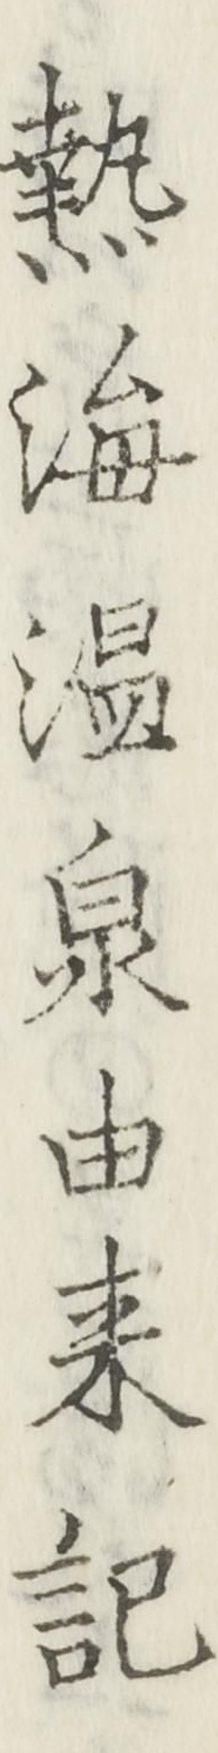熱海温泉由来記
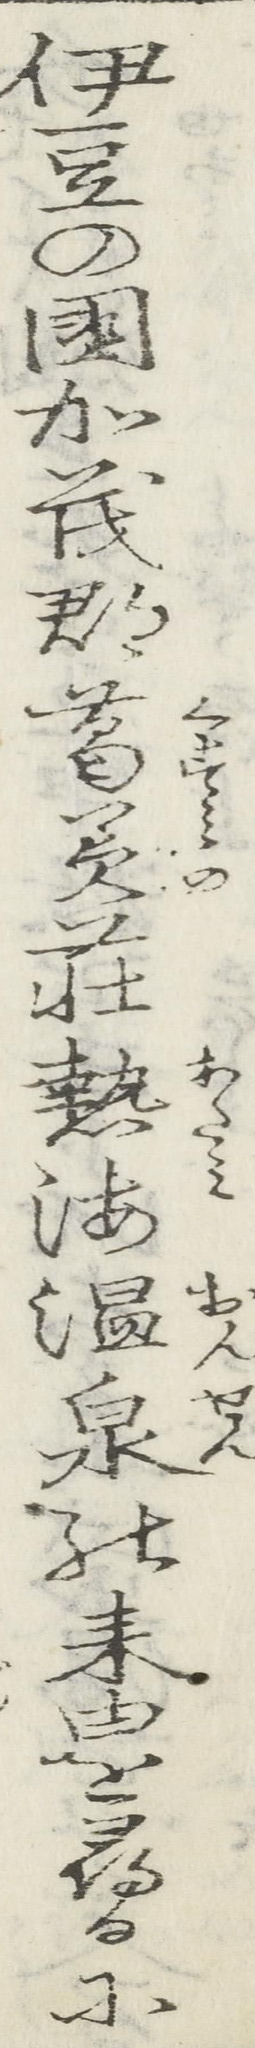伊豆の国加茂郡葛美荘熱海温泉の来由を尋るに
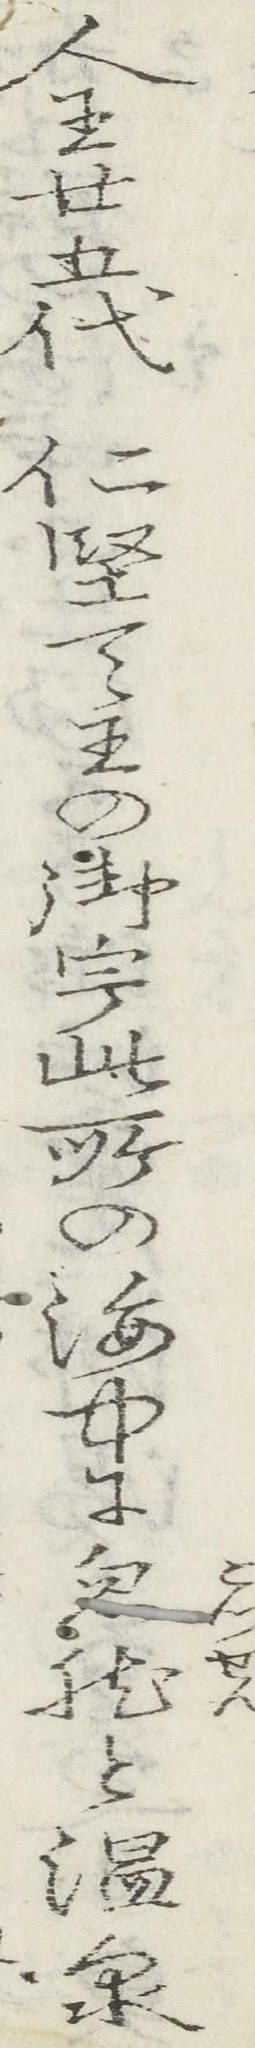人王廿五代仁堅天王の御宇此所の海中に忽然と温泉
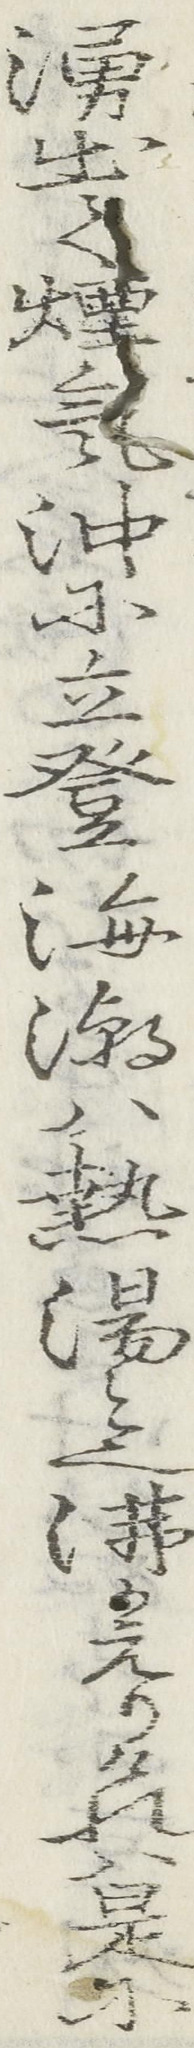湧出て煙気沖に立登海潮は熱湯と也沸かえりけれは是に
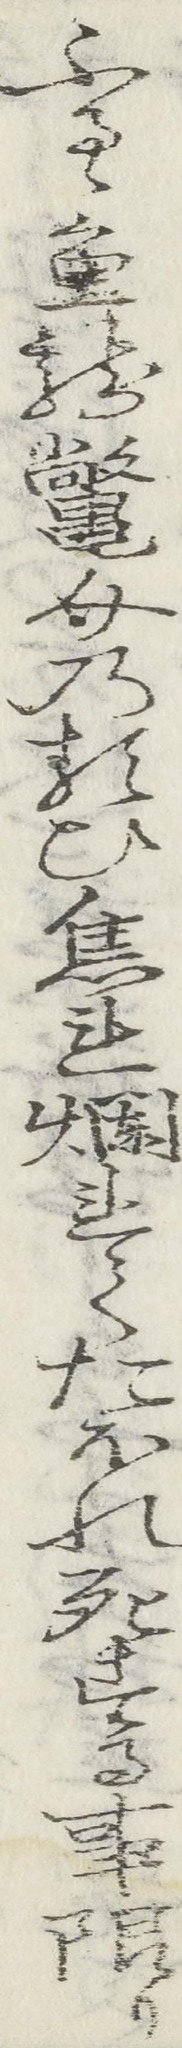ふるゝ魚類亀介の類ひ焦れ爛れてたほれ死する事限り
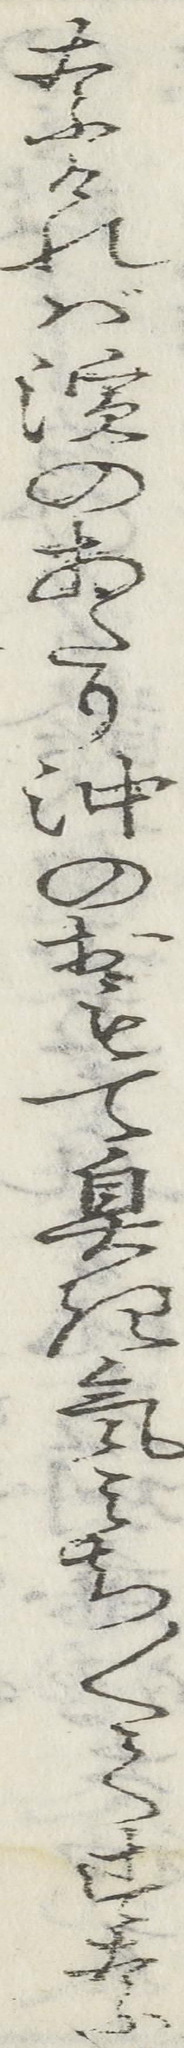なければ浜のあたり沖のおもて臭き気みち〳〵てすな
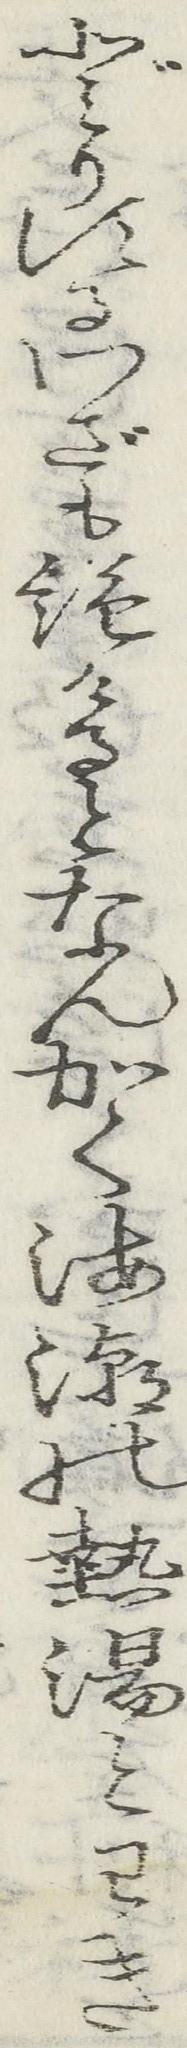どりするわざも絶けるとなんかく海潮の熱湯とわき
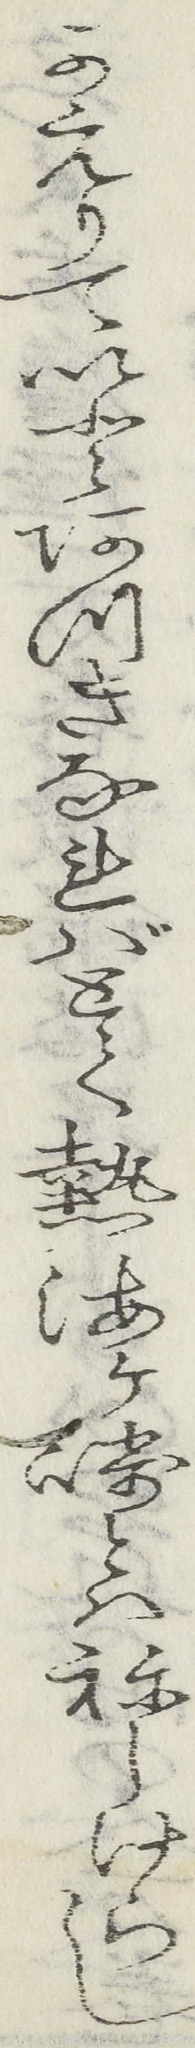かえりていとあつきなればとて熱海ヶ崎とは称しけらし
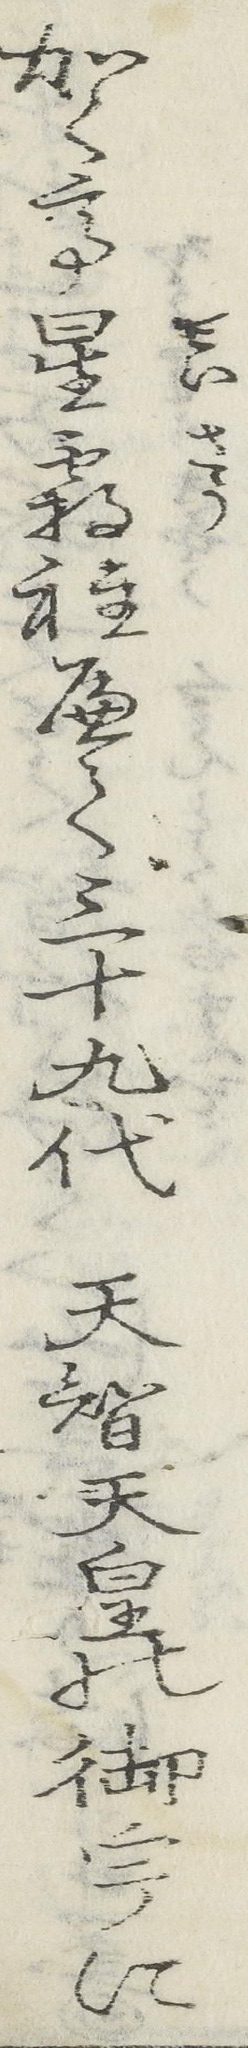かくて星霜種へて三十九代天智天皇の御宇に

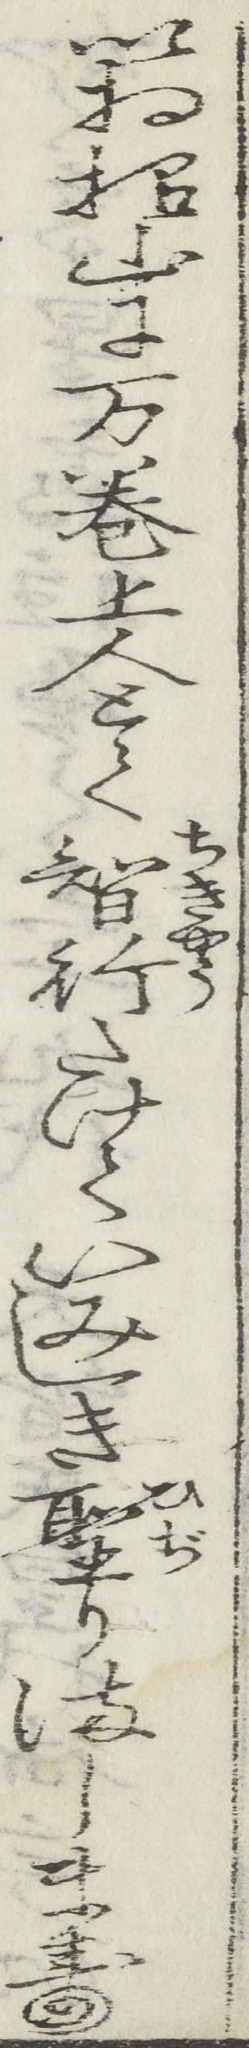箱根山に万巻上人とて智行たけくいみしき聖りまします
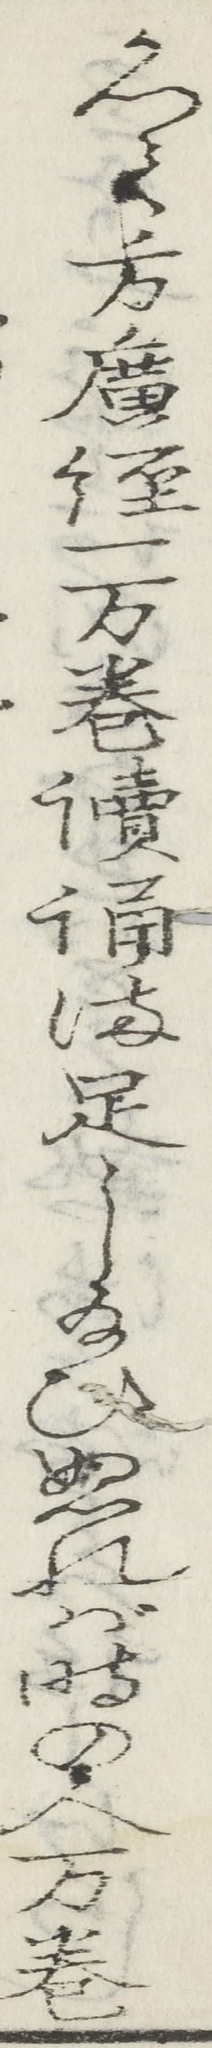かつて方広経一万巻読誦満足し給ひぬれば時の人万巻
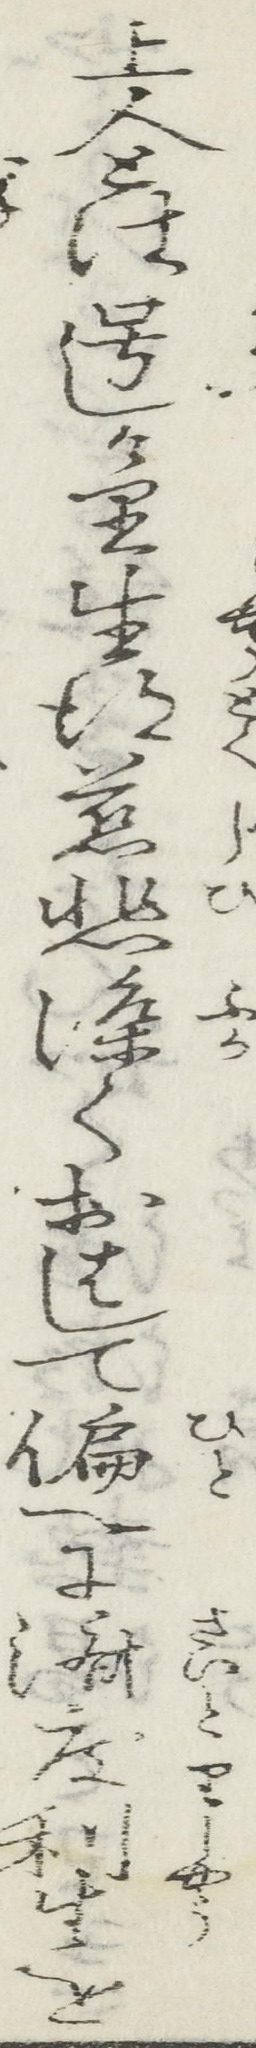上人とは号しけり生得慈悲深くおはして偏へに済度利生を
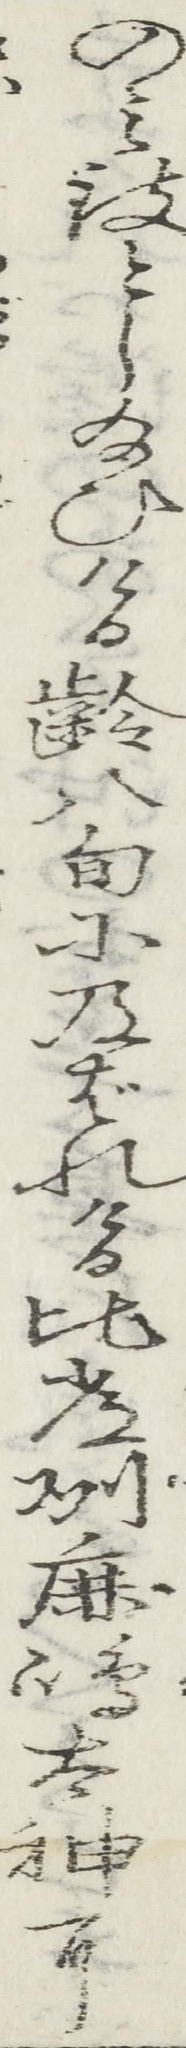のみ致とし給ひける齢八旬に及ばれける此常州鹿嶋太神に
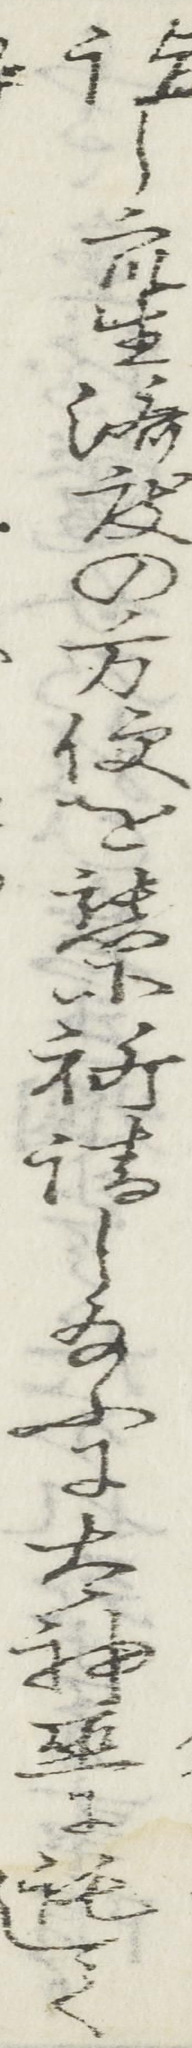詣し衆生済度の方便を懇に祈請し給ふに太神巫に託して
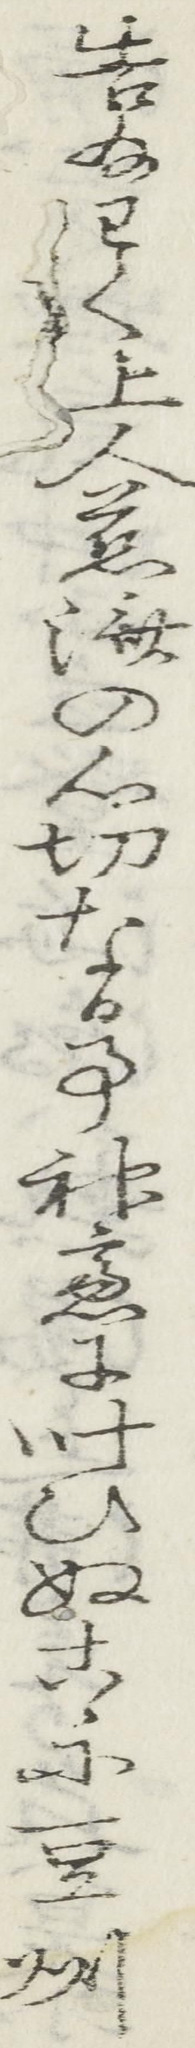告給わく上人慈済の心切なる事神慮に叶ひぬこゝに豆州
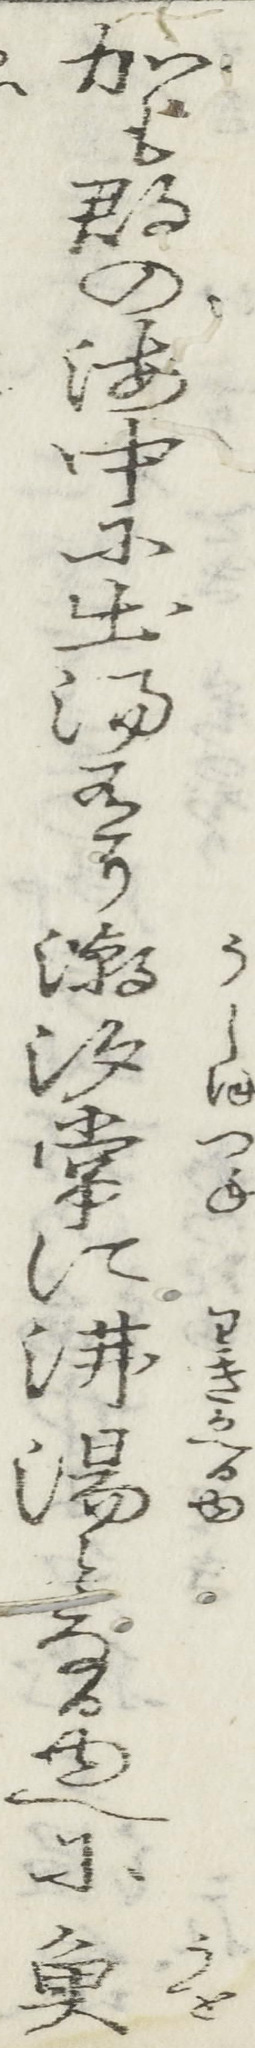かも郡の海中に出湯有り潮汐常に沸湯となるゆへに魚
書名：豆州熱海温泉由来記
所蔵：東京大学地震研究所図書室 Earthquake Research Institute Library, The University of Tokyo, JAPAN
